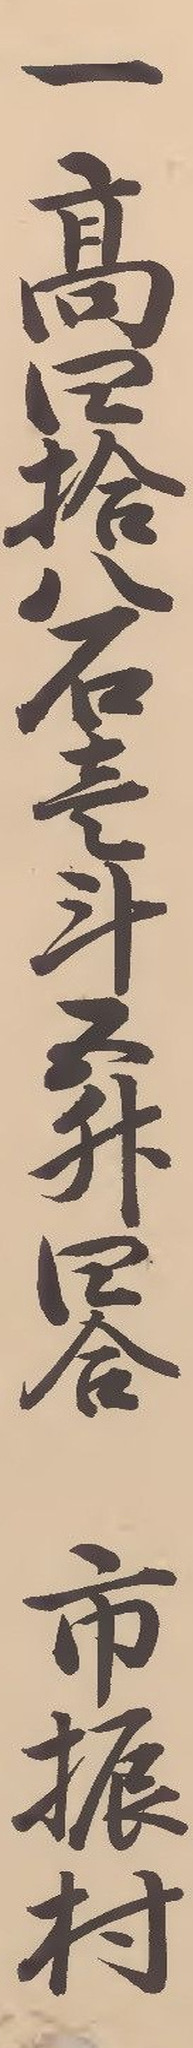一高四拾八石壱斗五升四合市振村
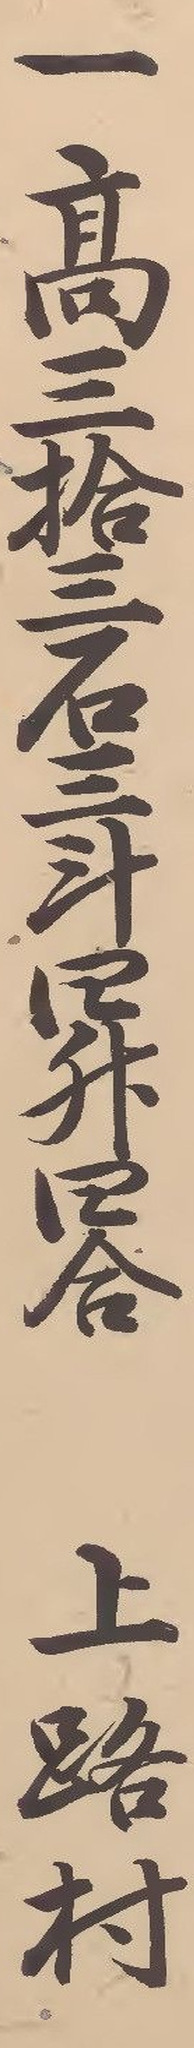一高三拾三石三斗四升四合上路村

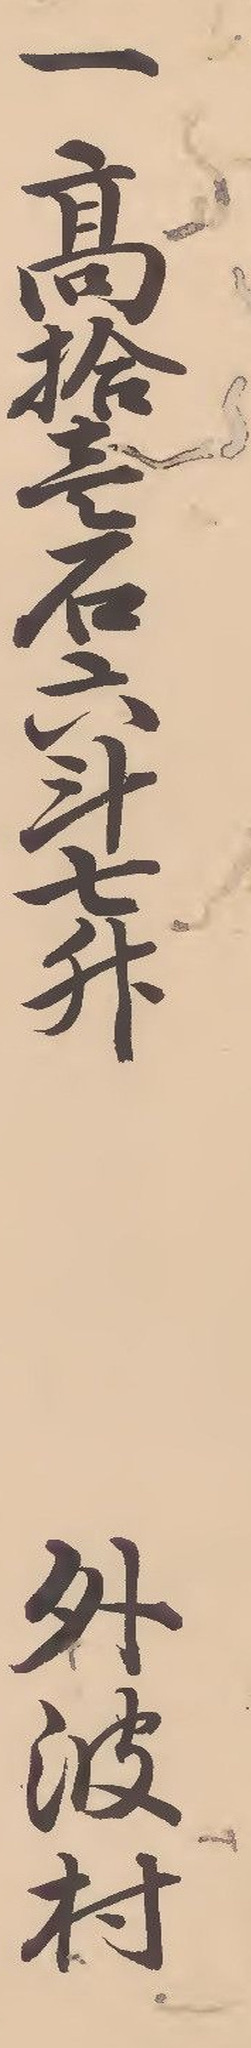一高拾壱石六斗七升外波村
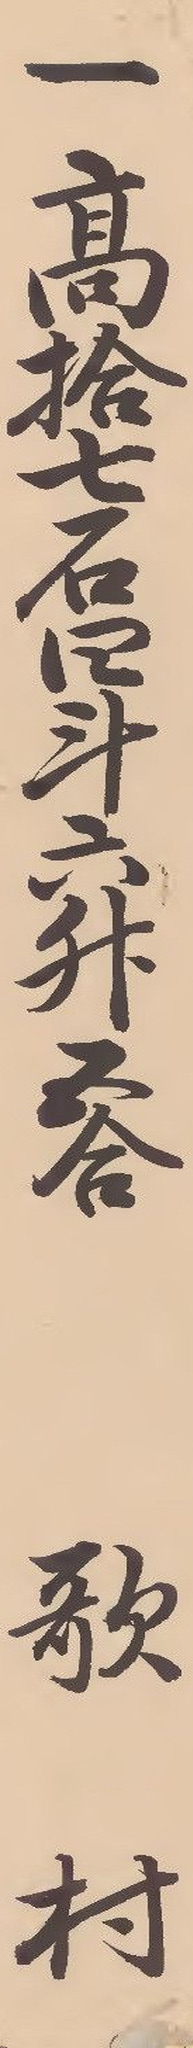一高拾七石四斗六升五合歌村
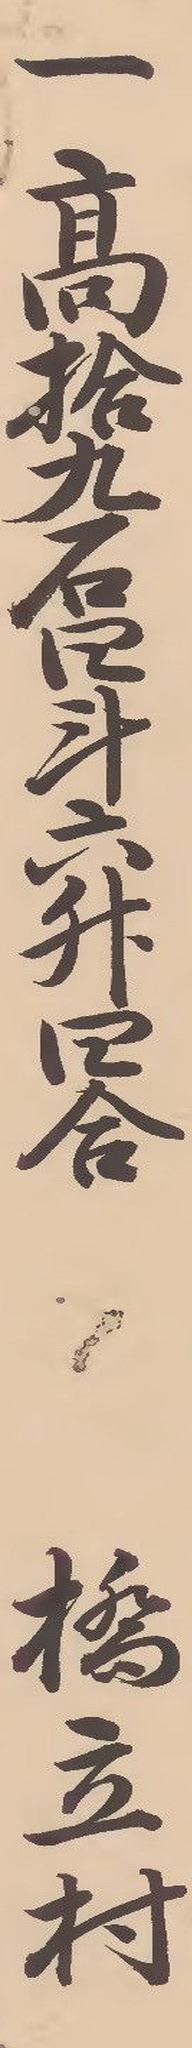一高拾九石四斗六升四合橋立村
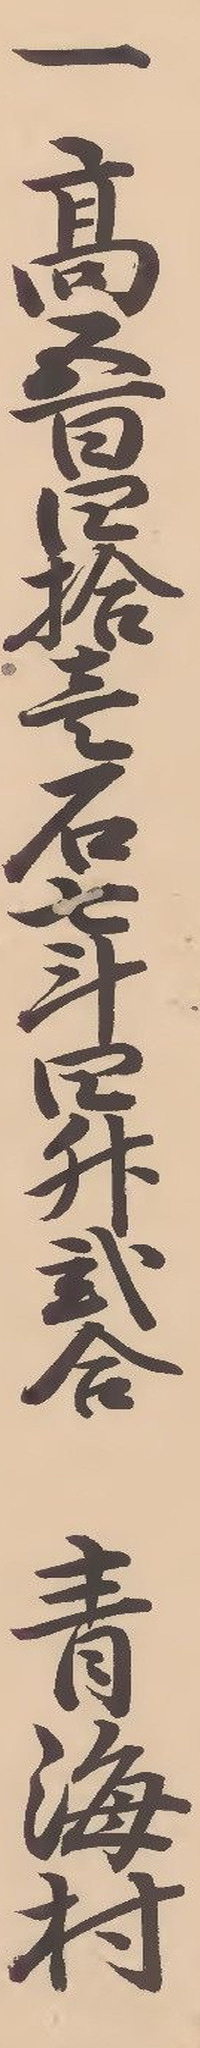一高五百四拾壱石七斗四升弐合青海村
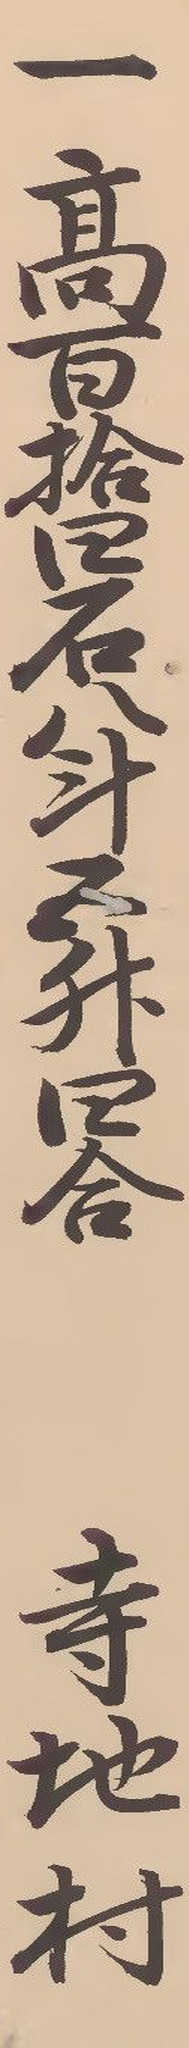一高百拾四石八斗五升四合寺地村
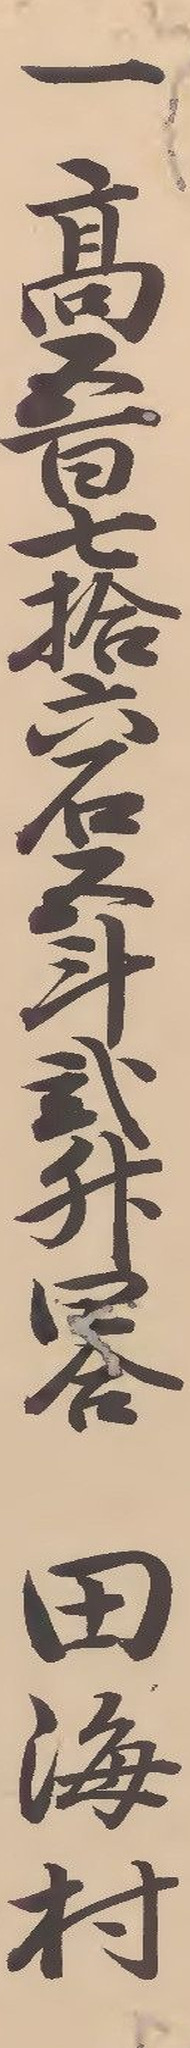一高五百七拾六石五斗弐升四合田海村
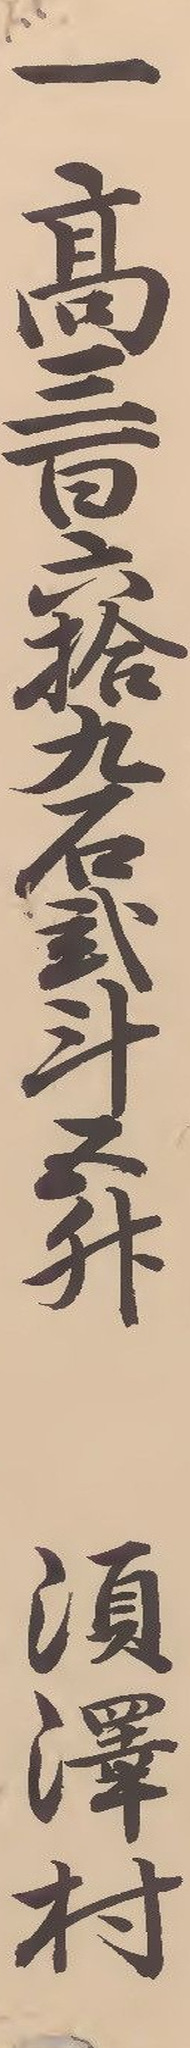一高三百六拾九石弐斗五升須沢村
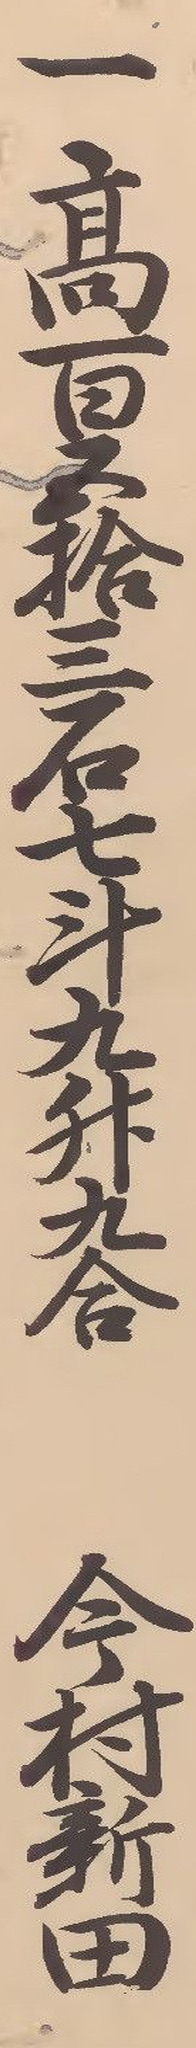一高百五拾三石七斗九升九合今村新田

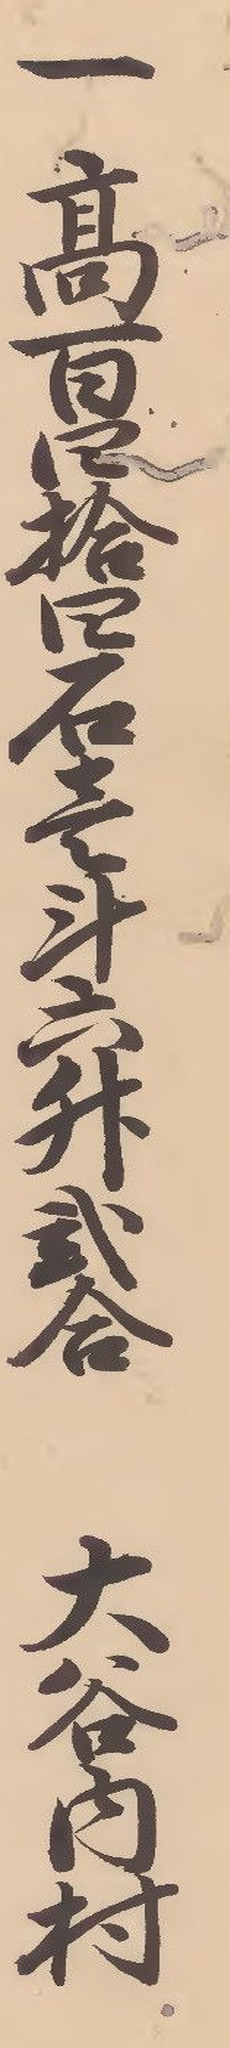一高百四拾四石壱斗六升弐合大谷内村
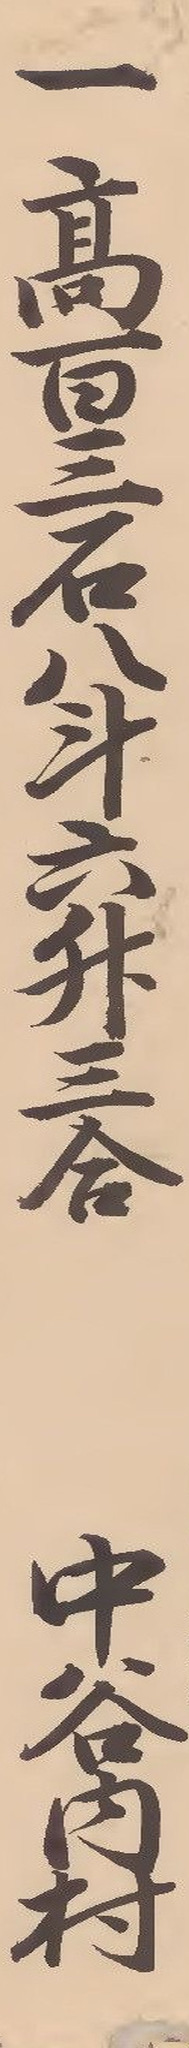一高百三石八斗六升三合中谷内村
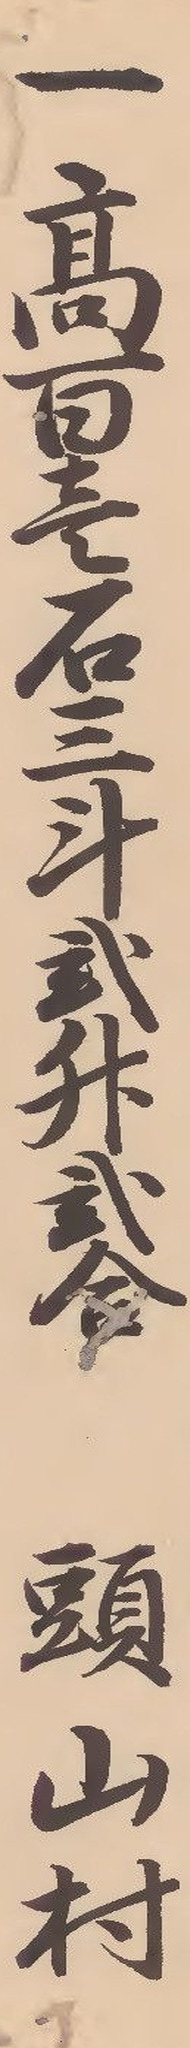一高百壱石三斗弐升弐合頭山村
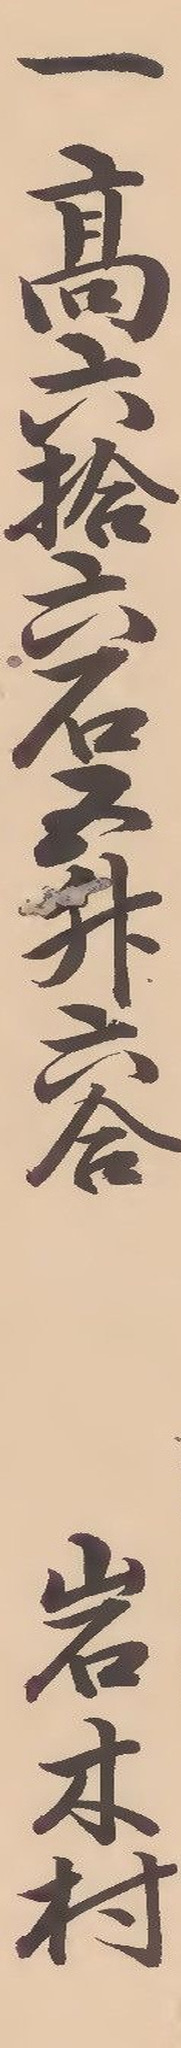一高六拾六石五升六合岩木村
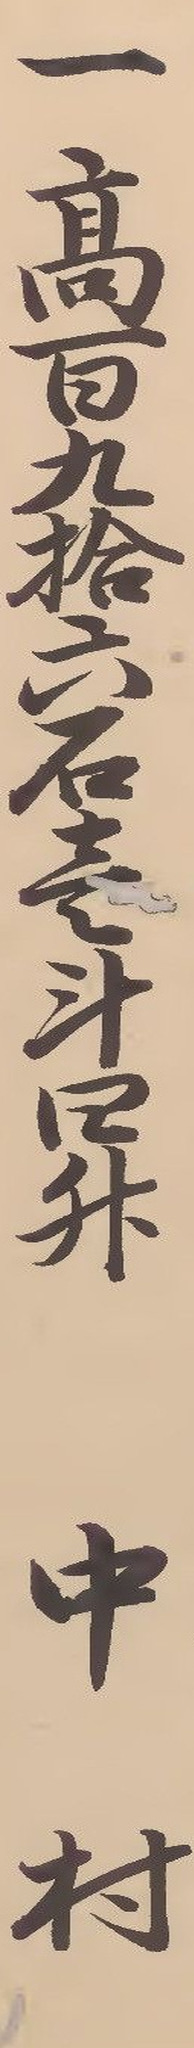一高百九拾六石壱斗四升中村
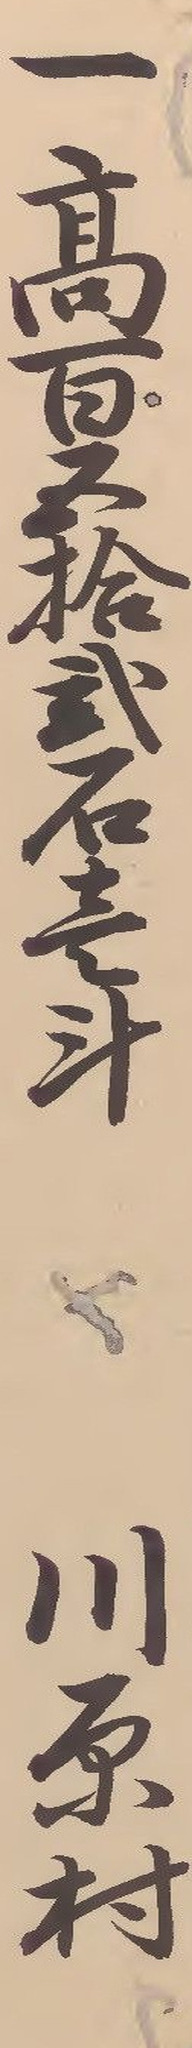一高百五拾弐石壱斗川原村
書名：越後国郷帳　上
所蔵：国立公文書館 National Archives of Japan
